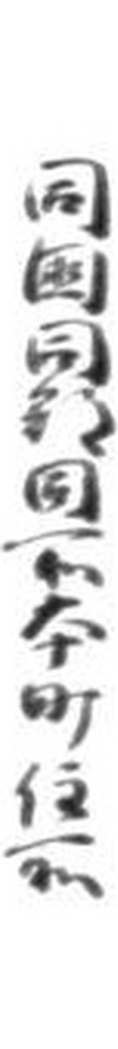同国同郡同所本町住所
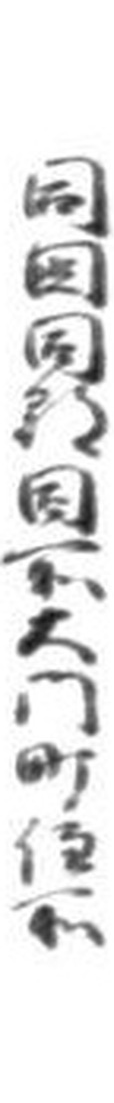同国同郡同所大門町住所

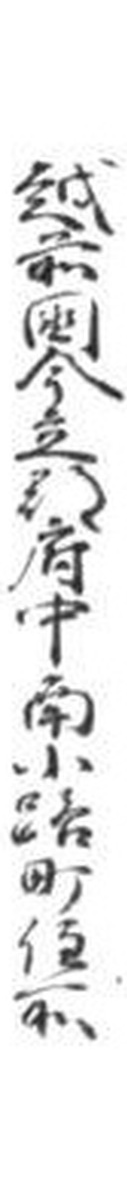越前国今立郡府中南小路町住所
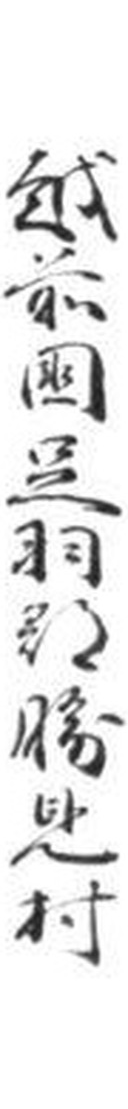越前国足羽郡勝見村
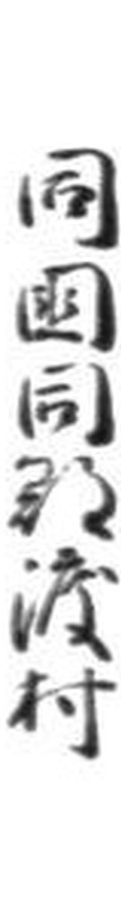同国同郡渡村
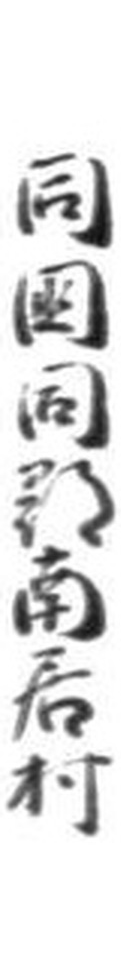同国同郡南居村
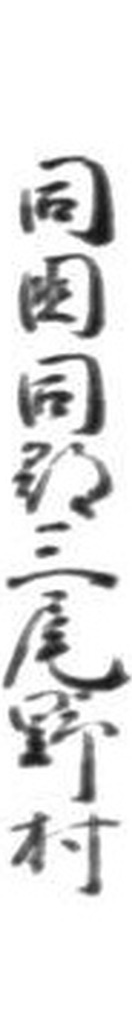同国同郡三尾野村
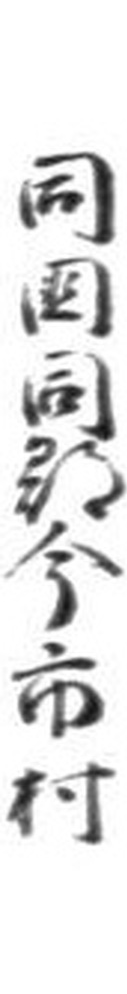同国同郡今市村

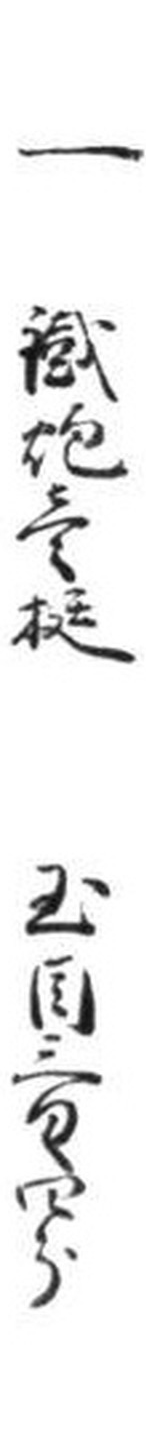一鉄炮壱挺玉目四匁三四郎
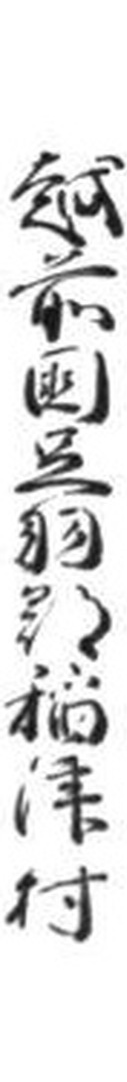越前国足羽郡稲津村
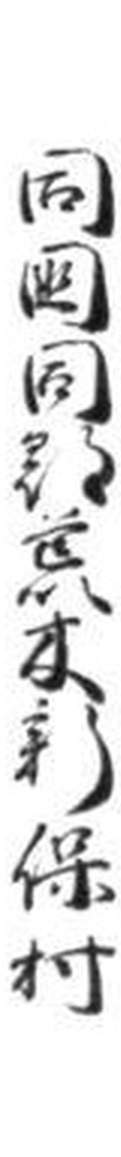同国同郡荒木新保村
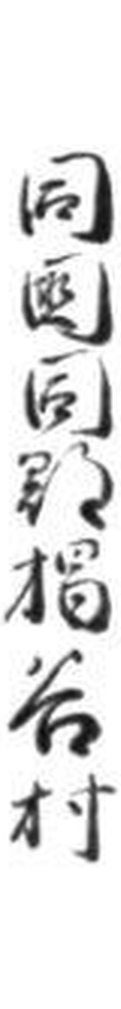同国同郡椙谷村
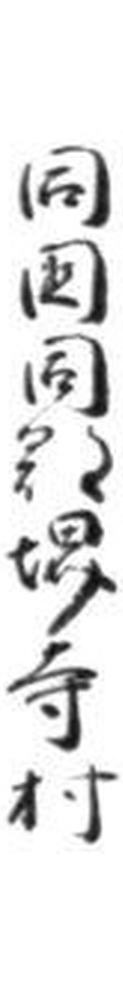同国同郡堺寺村
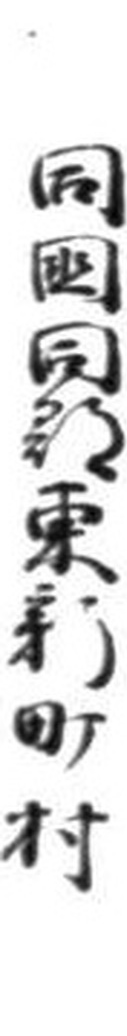同国同郡東新町村
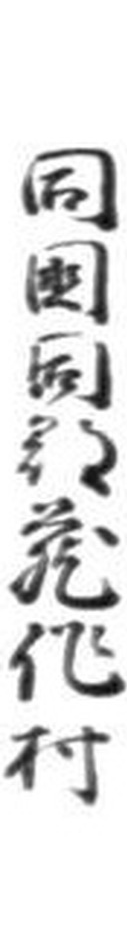同国同郡蔵作村
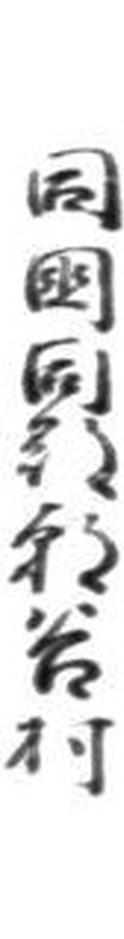同国同郡朝谷村
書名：家譜 十七 吉品公 従元禄元年到同二年
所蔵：福井県文書館 Fukui Prefectural Archives
